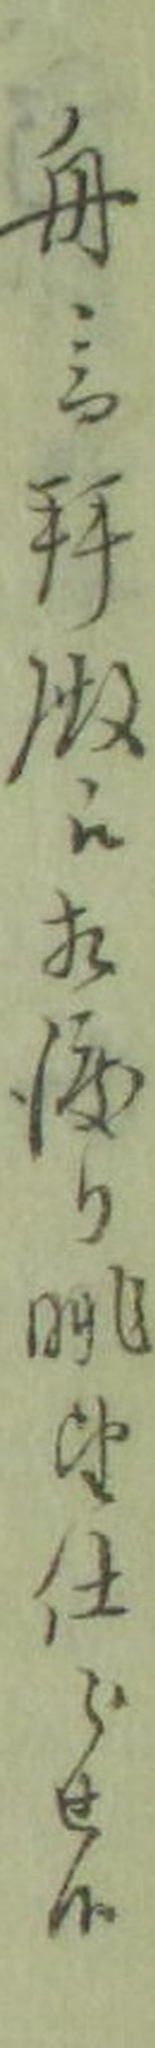舟に而拝攸被相渡り眺望仕らせ候
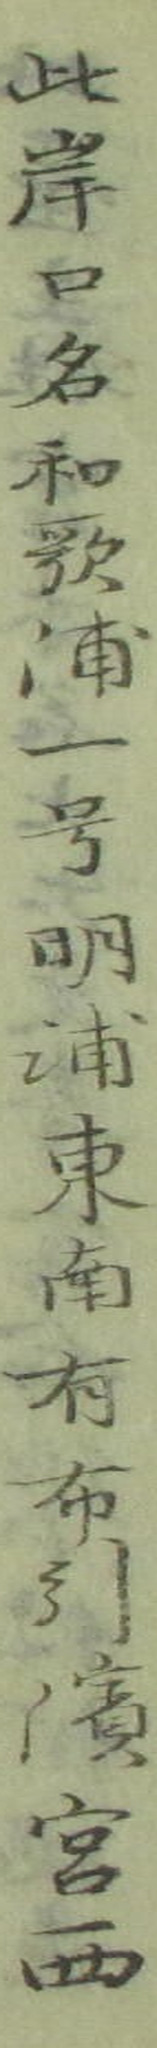此岸口名和歌浦一号明浦東南有布引浜宮西
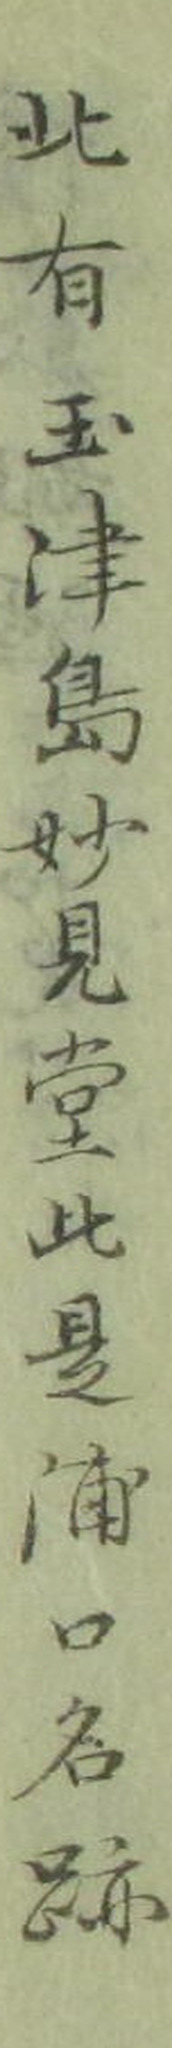北有玉津島妙見堂此是浦口名跡鳴
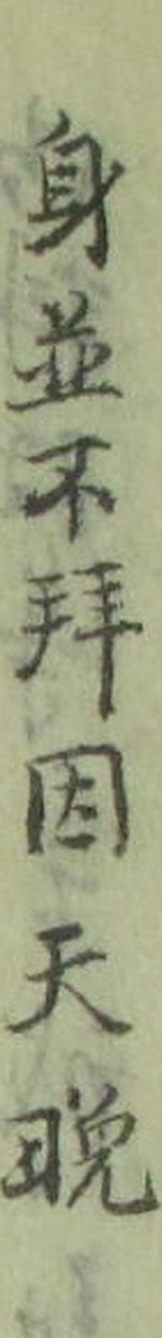身並不拝因天晩王
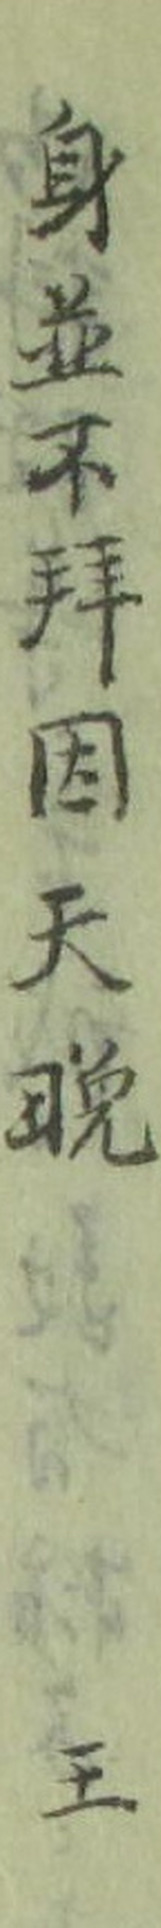身並不拝因天晩王
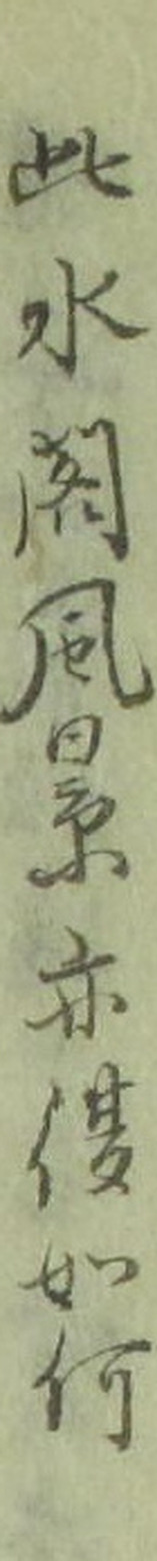此水閣風景亦復如何鳴
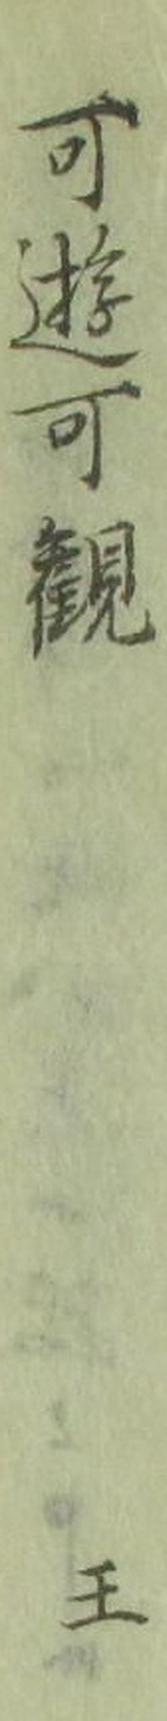可遊可観王
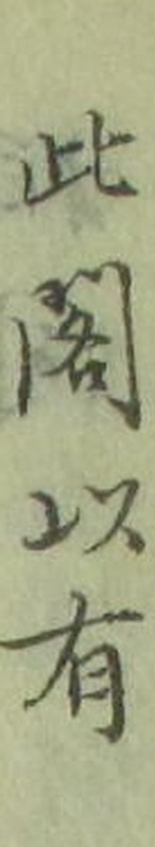此閣以有
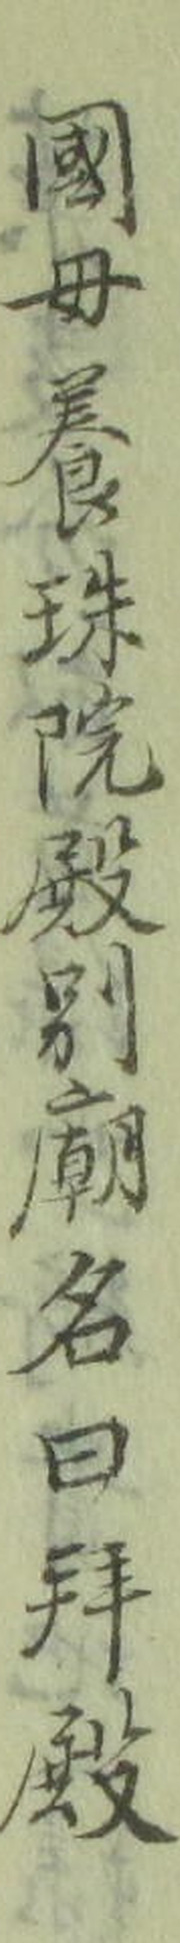国母養珠院殿別廟名曰拝殿
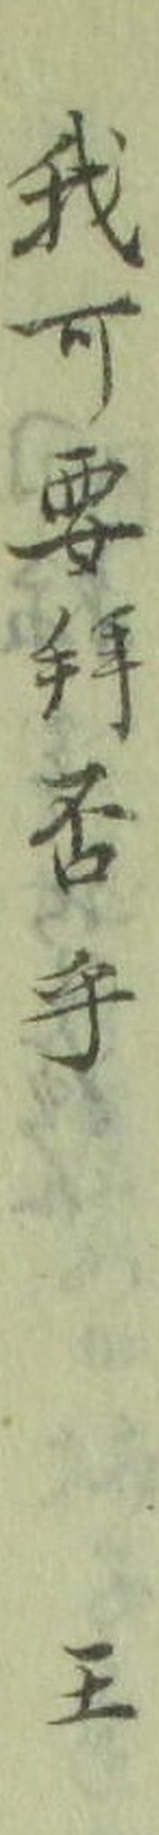我可要拝否乎王
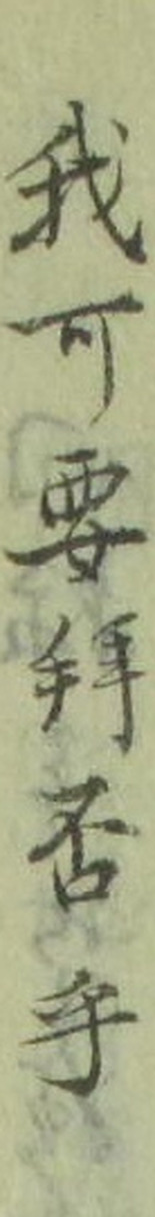我可要拝否乎王
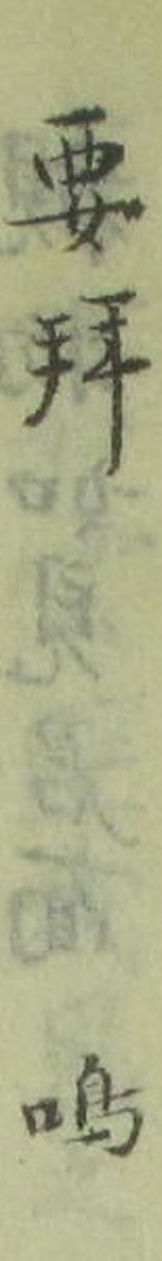要拝鳴
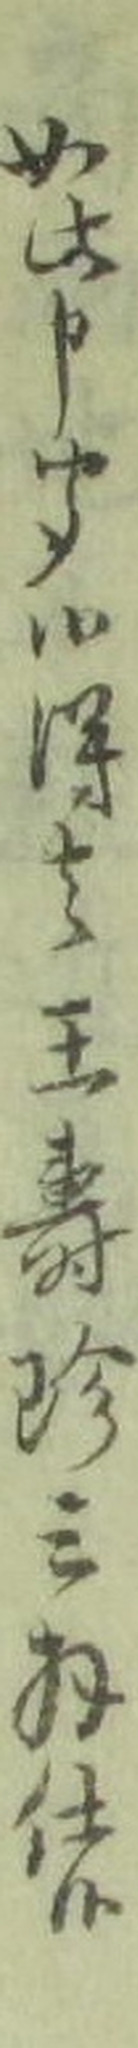如此申聞候得は王寿珍三拝仕候
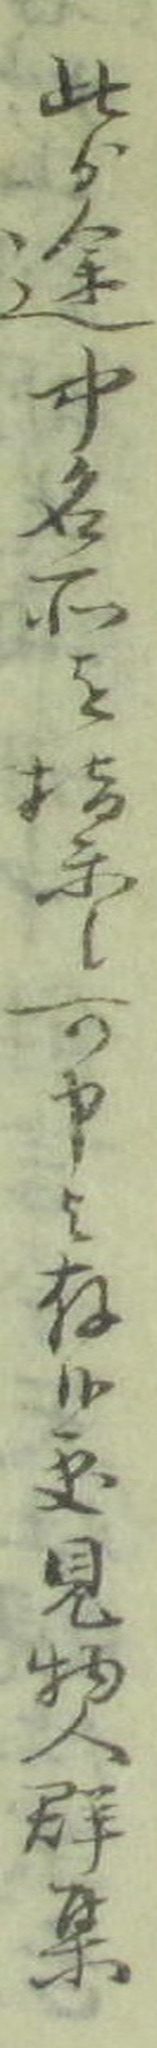此ゟ途中名所を指示し可申は存候処見物人群集
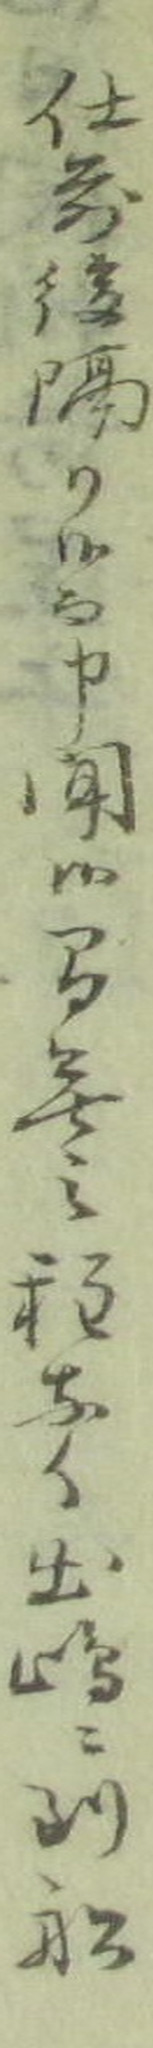仕万復隔り候而申聞候間無之程なく出島に到船
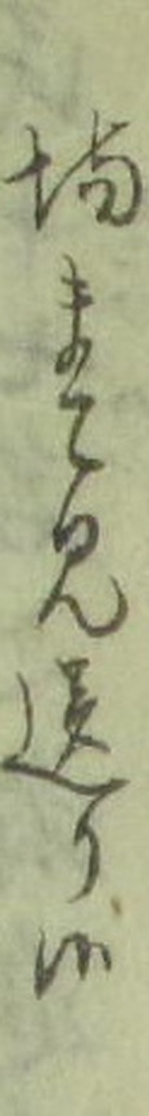場まて見送り候
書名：紀州九木浦庄屋記録 四
